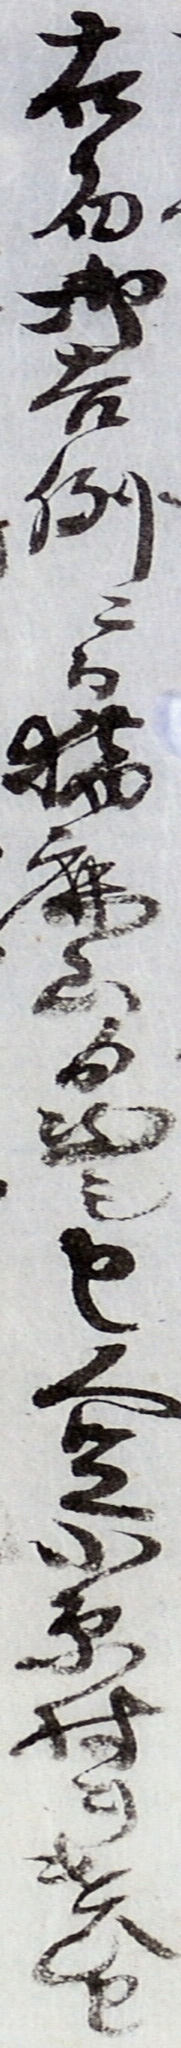右者御吉例ニ而猪鹿山ゟ致シ申候人足小原村ヲ遣申候
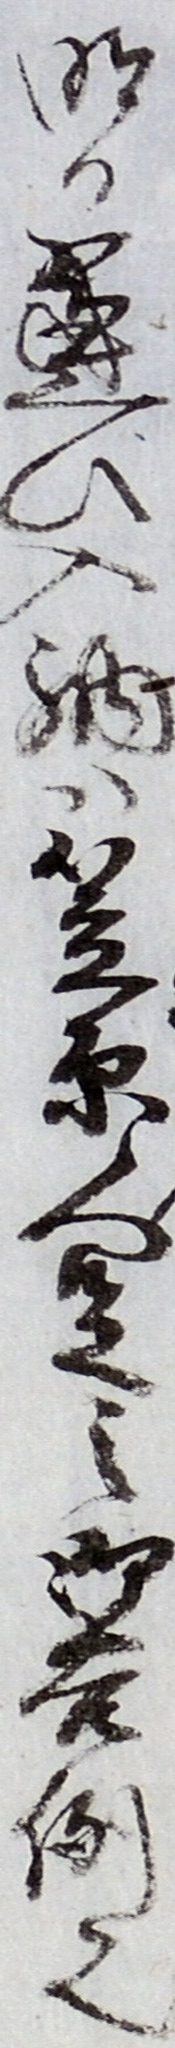明日運ひ入納ハ笠原人足之御吉例也
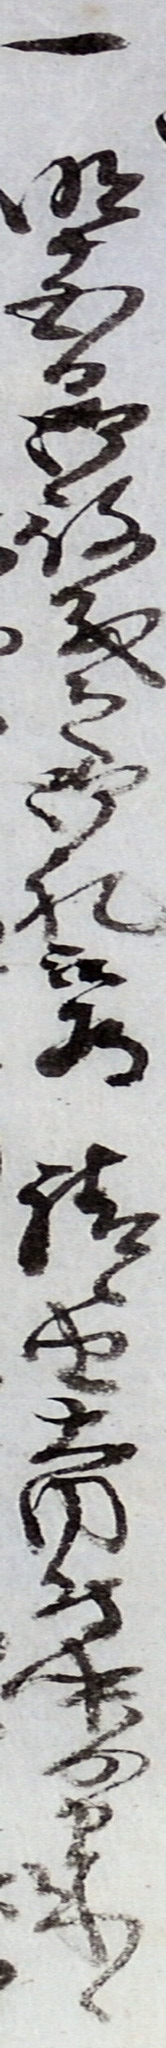一明十五日御役義之御礼被為請候由大目付中ゟ申来候
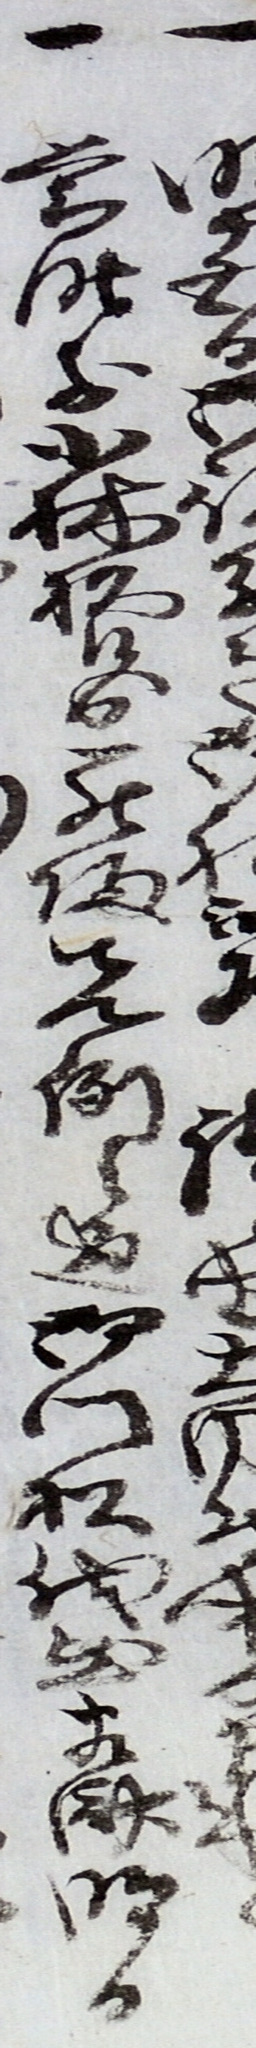一暮時分小林杦左衛門罷帰先例之通御門松伐出相済明日
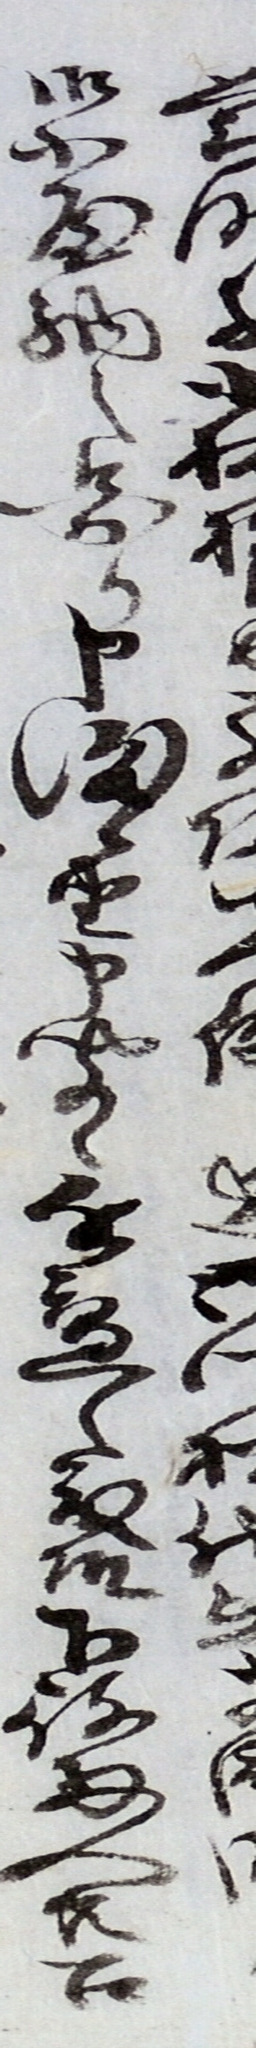御小屋納之図り申渡候由申聞候近辺之義故下役両人共召
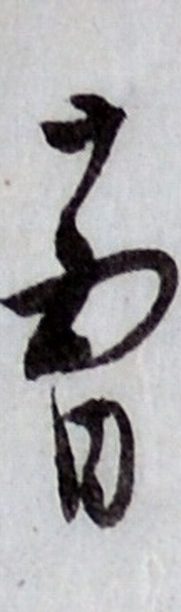十五日
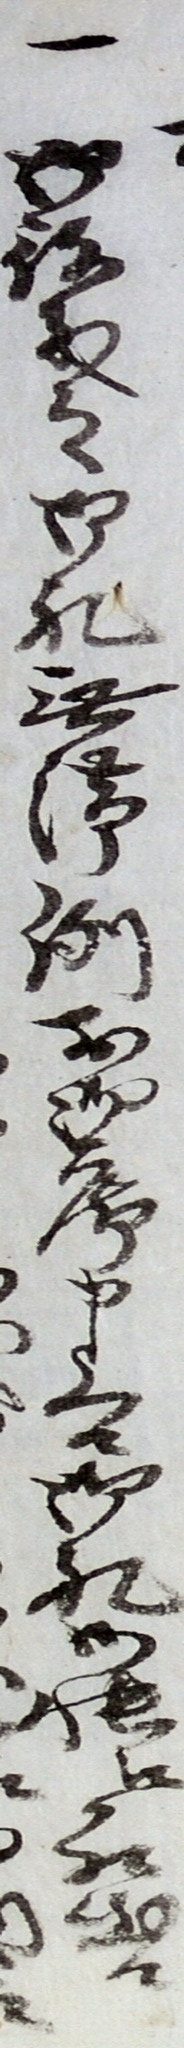一御役義之御礼無滞例於御席も申上候御礼帳江罷出候
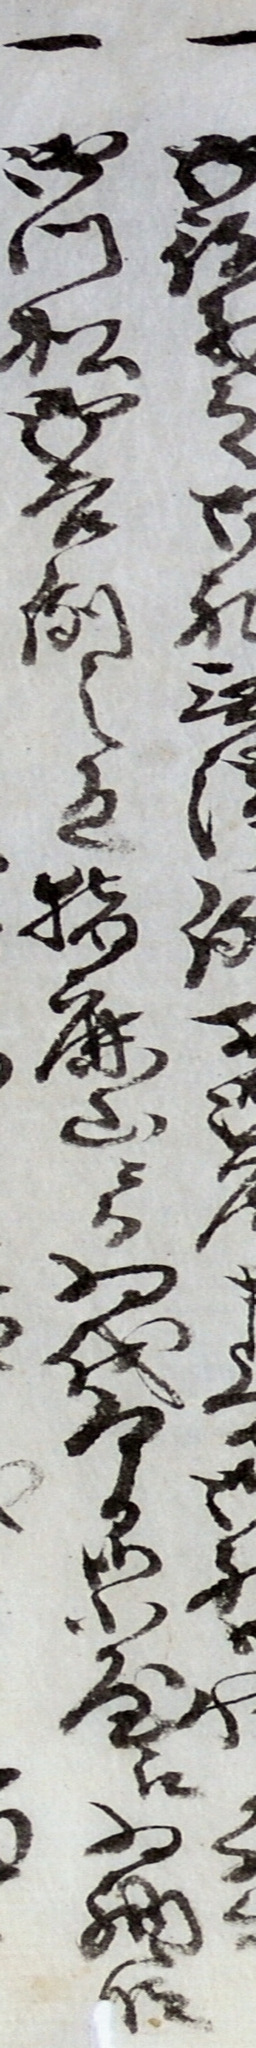一御門松御吉例也之猪鹿山ニ而為伐今日御小屋江為納候
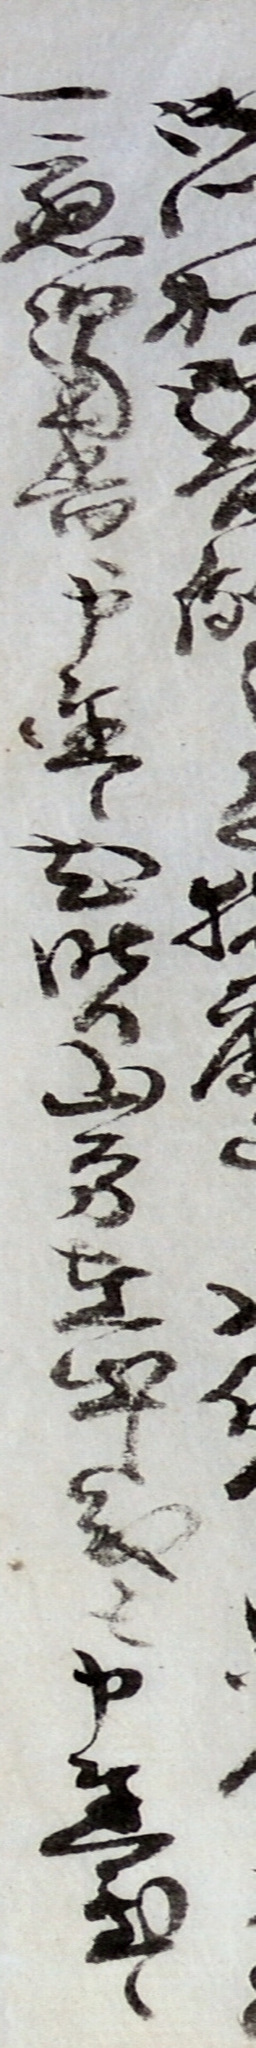一応御用番へ申置候尤昨日山方在出候義も申達置候

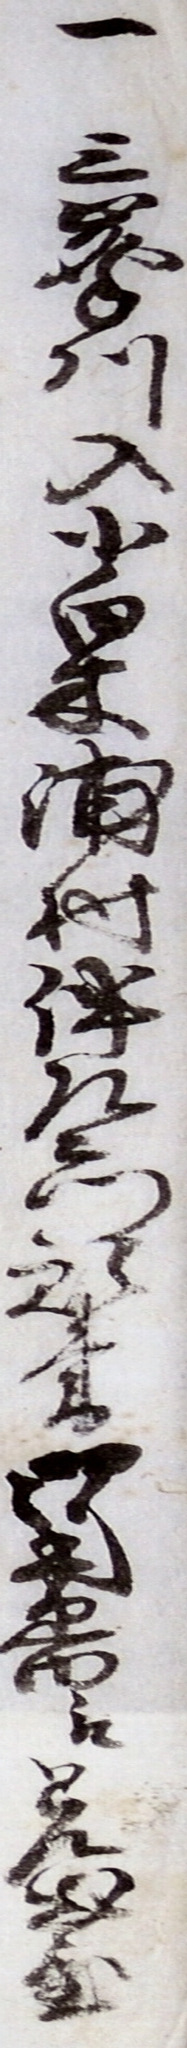一三峯川入小白木浦村伴左衛門願書御用番江差出置
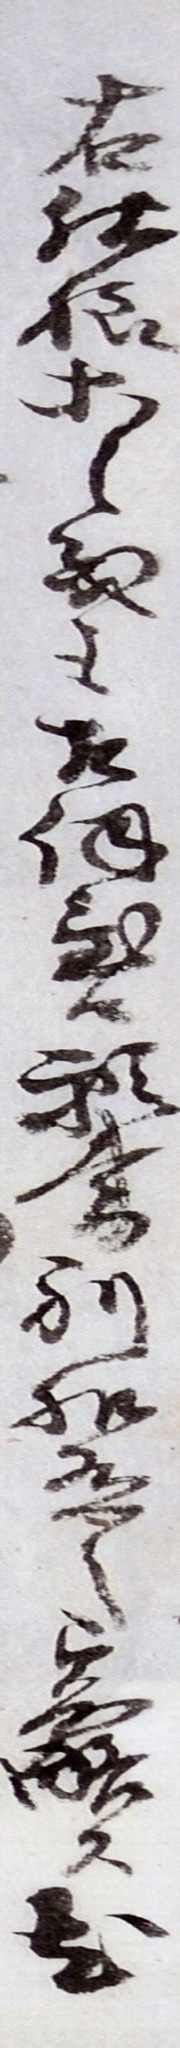右仕様等之義も相伺置候願書別扣有之候間略ス尤
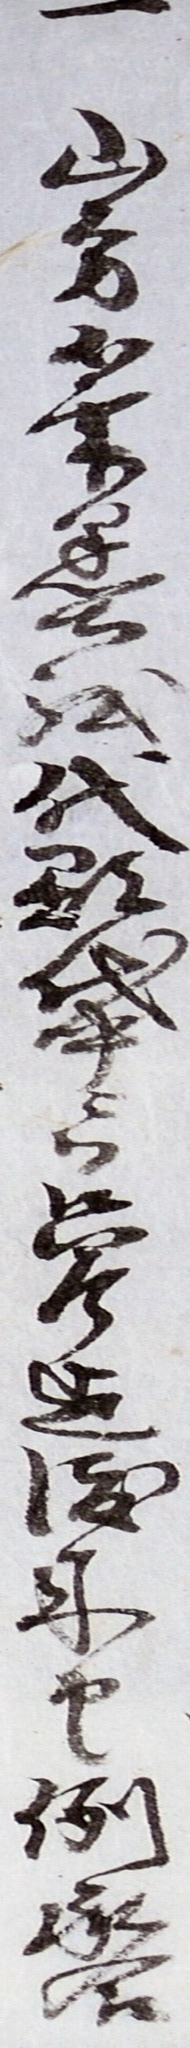一山方筆墨紙代郡代中ニ而只今迄渡来申候例承合
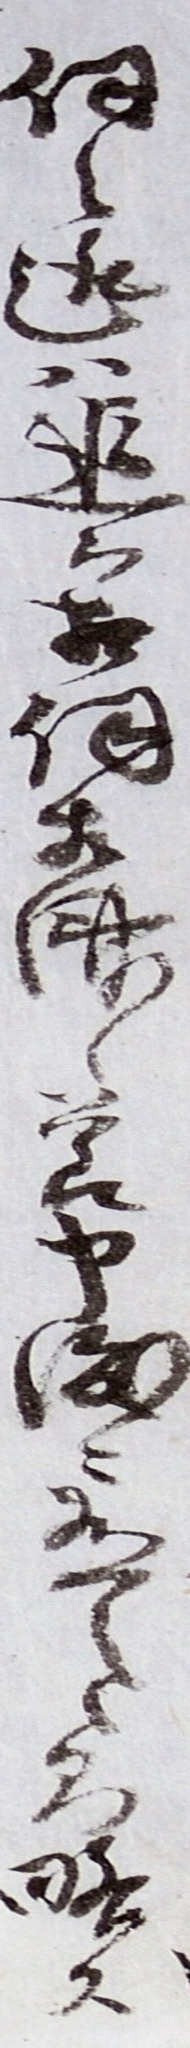伺之趣ハ追而相伺相済候節申渡ニ有之候間略ス
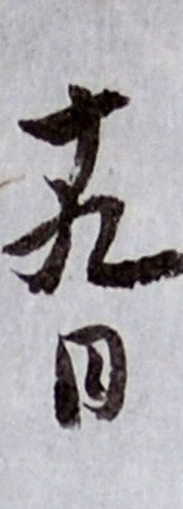十九日
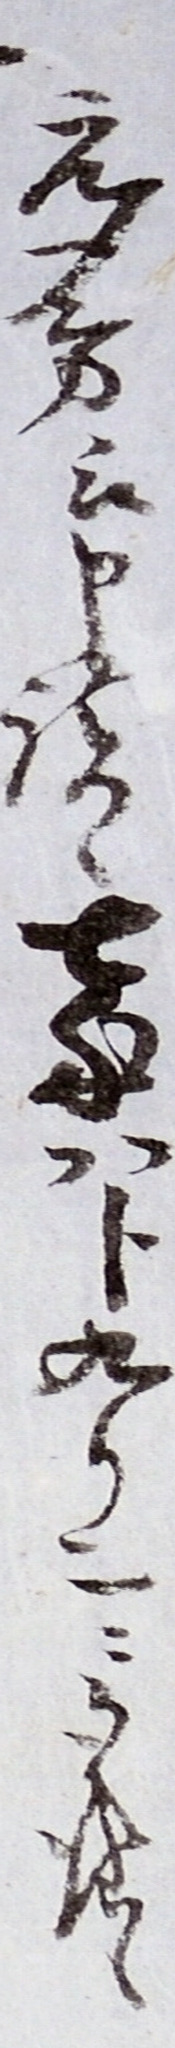元〆方江申談候七匁八分九りニ御座候
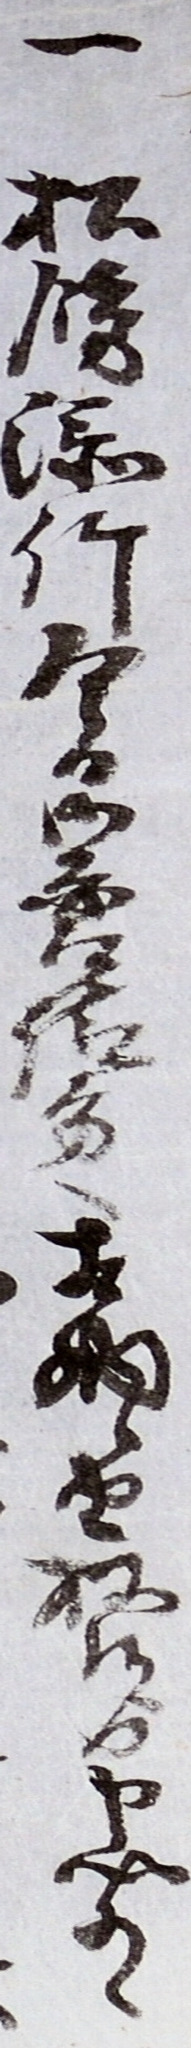一松餝添竹今日御普請方へ相納候由杦左衛門申聞候
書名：御山奉行御用留
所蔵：伊那市立高遠町図書館・合同会社AMANE
